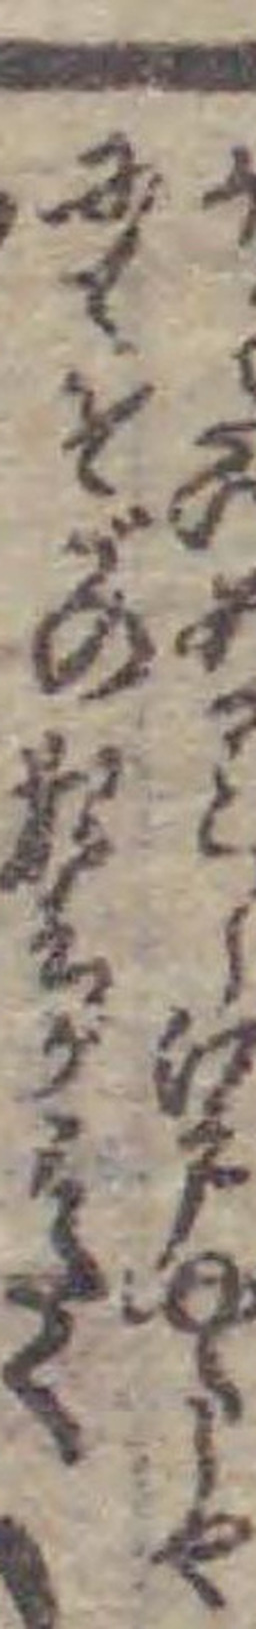にてそがの狂言がみたく
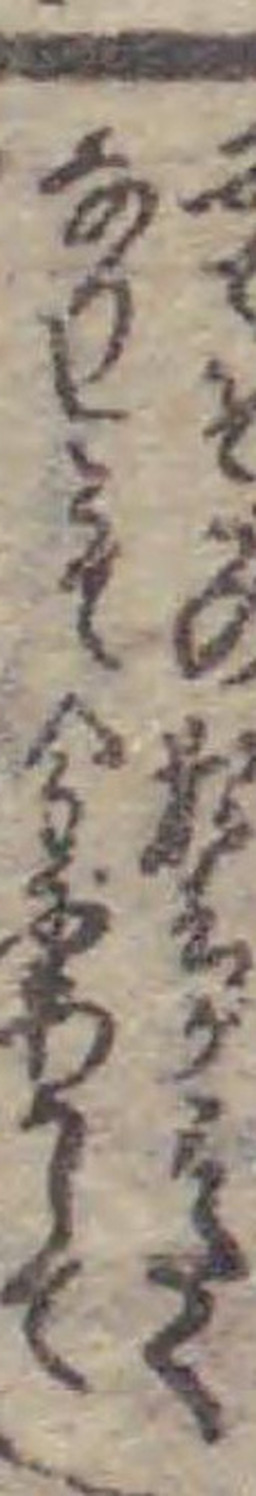なりしとて金にあかして
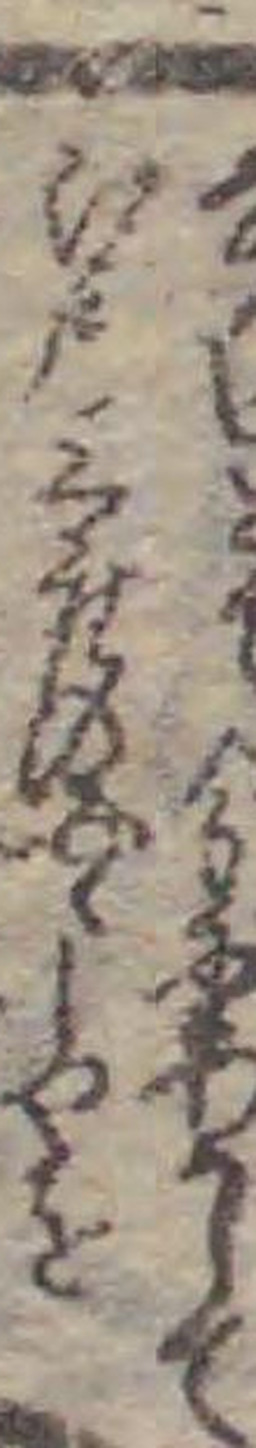江戸三座のやくしやを
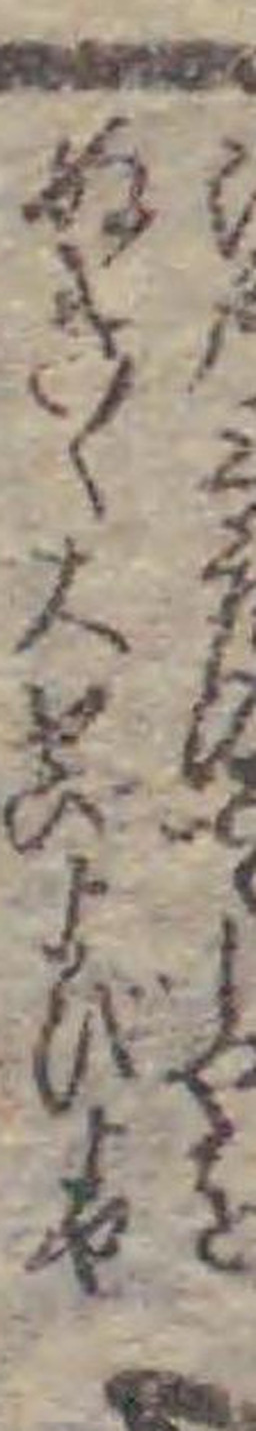ぬき〳〵大せいよびよせ
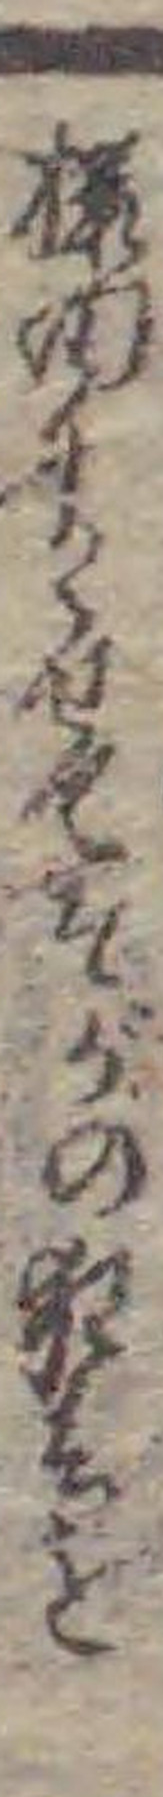桜田にかゝせてそがの狂言を
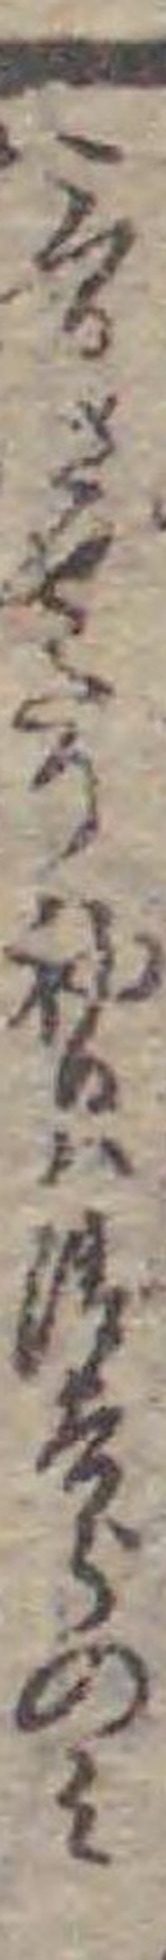三日させたり初日は清太郎のみ
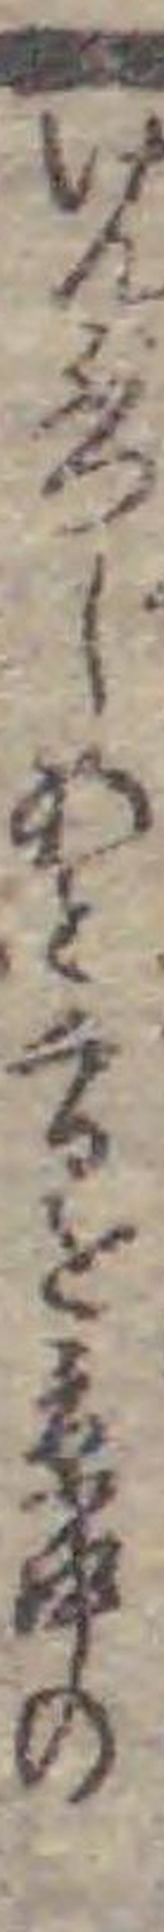けんぶつしあと二日を京中の
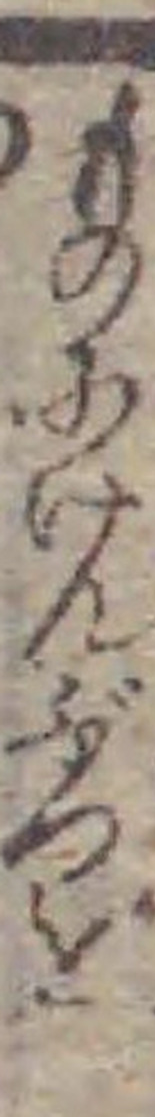ものにけんぶつを
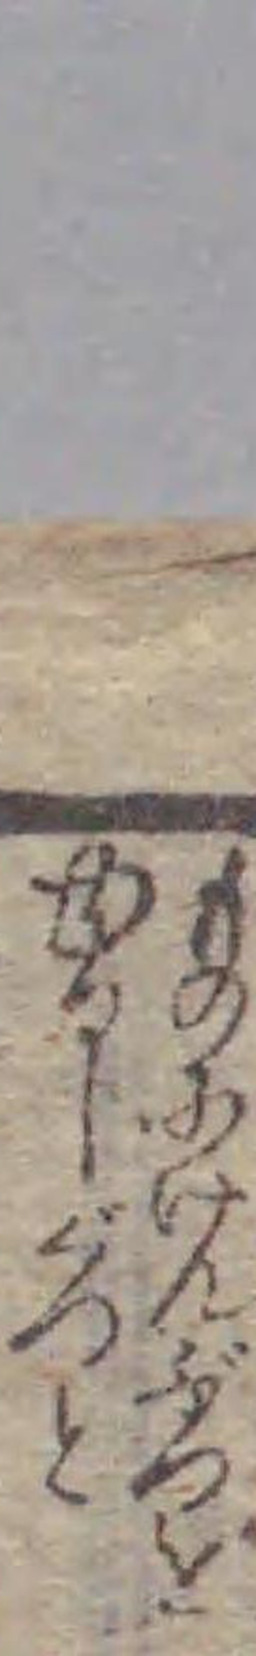ゆるしぐつと
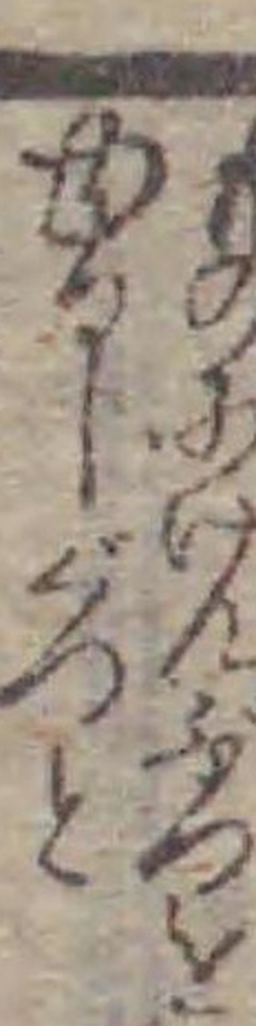ゆるしぐつと
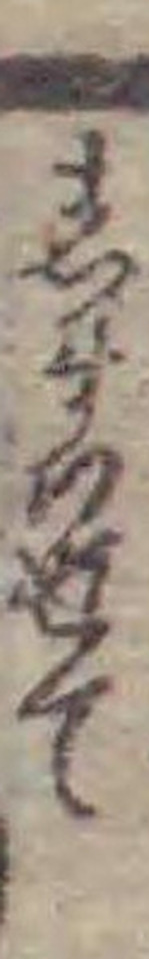しまわせて
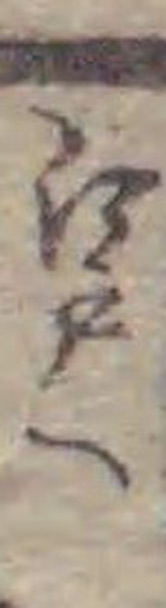江戸へ
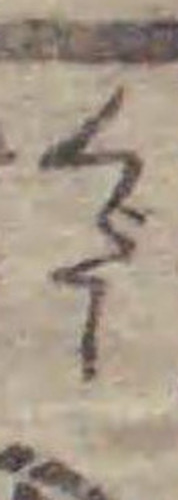くらし
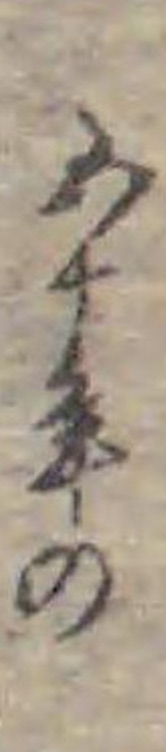五十年の

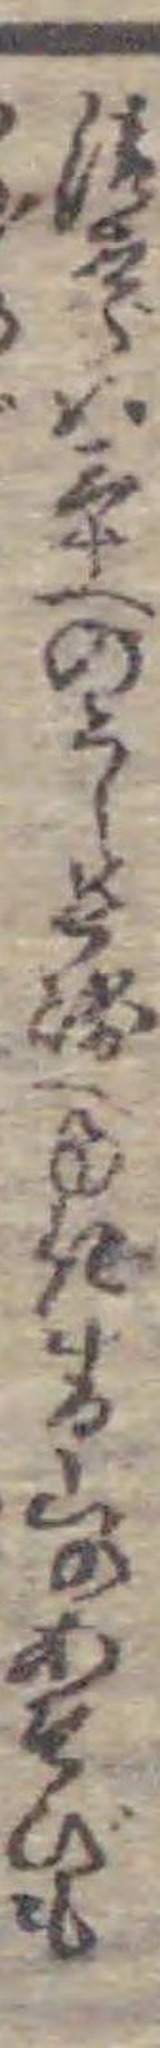清太郎は三十一のとし長崎へゆきまる山のあそびも
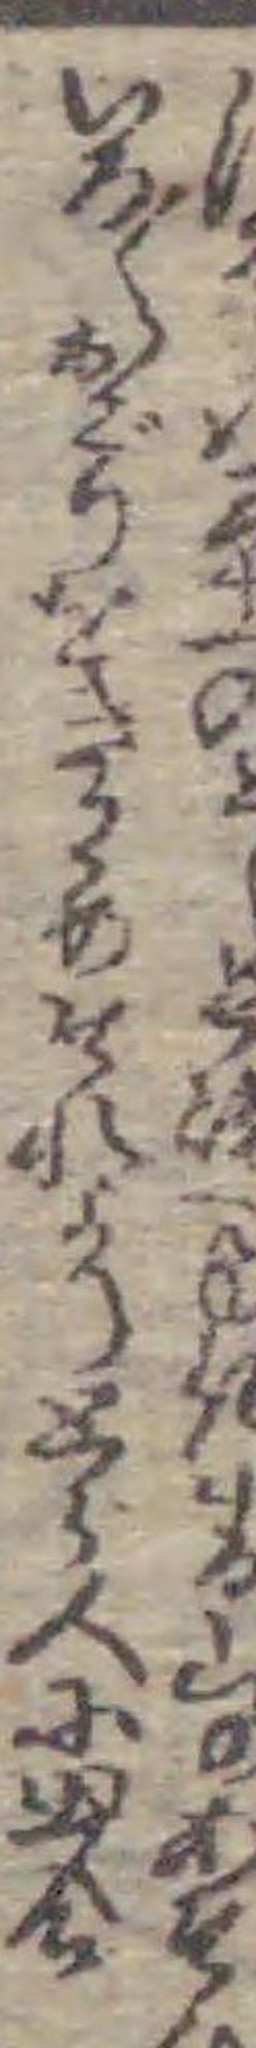いろ〳〵おごりをきわめそれよりとう人に出合
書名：見徳一炊夢 : 3巻
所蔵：国立国会図書館 National Diet Library, JAPAN
